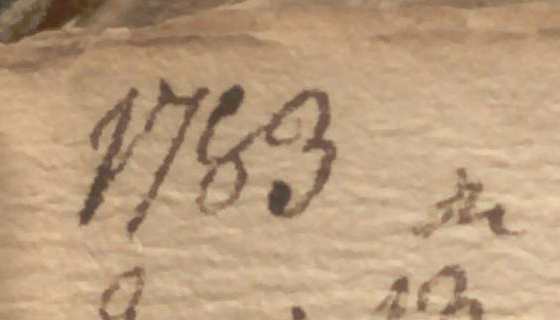1783
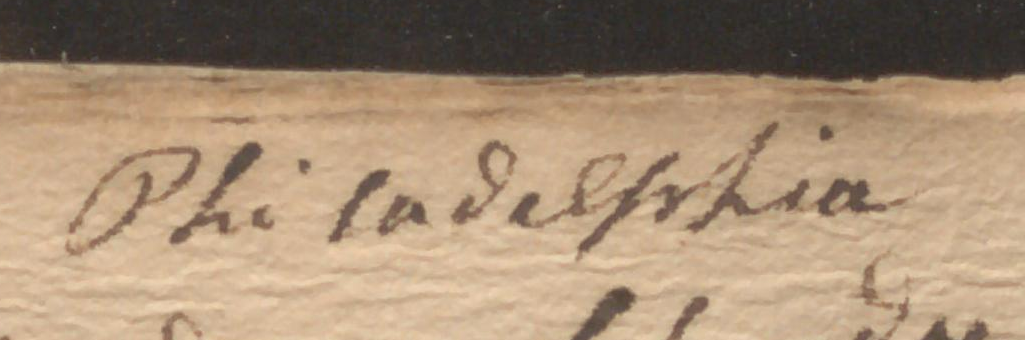Phi cadelphia
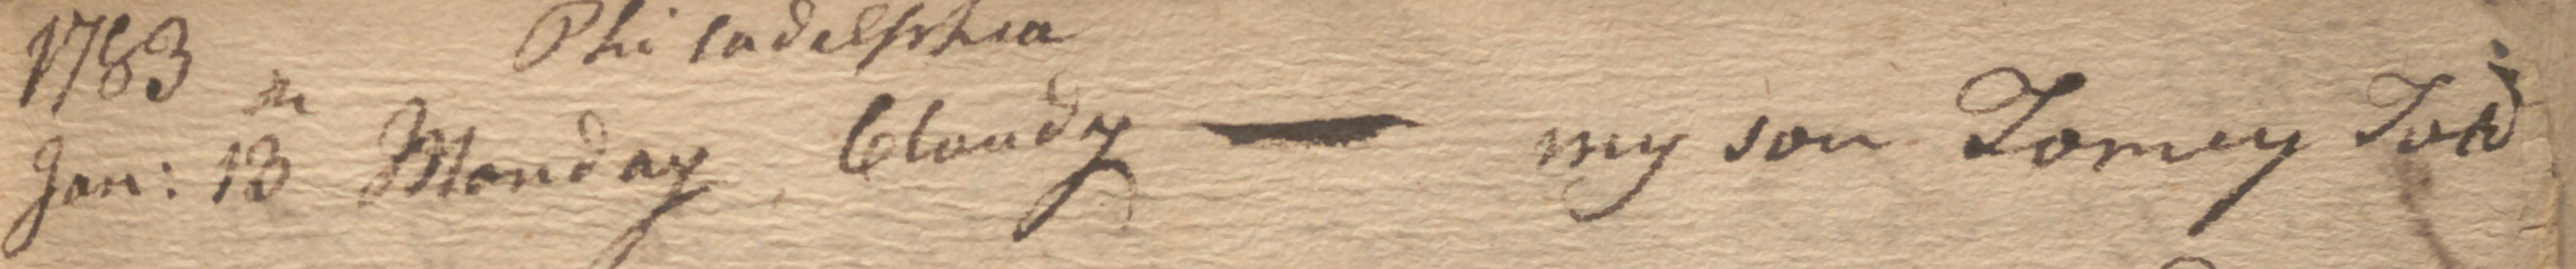Jan: 13^th Monday Cloudy my son Tomey Told
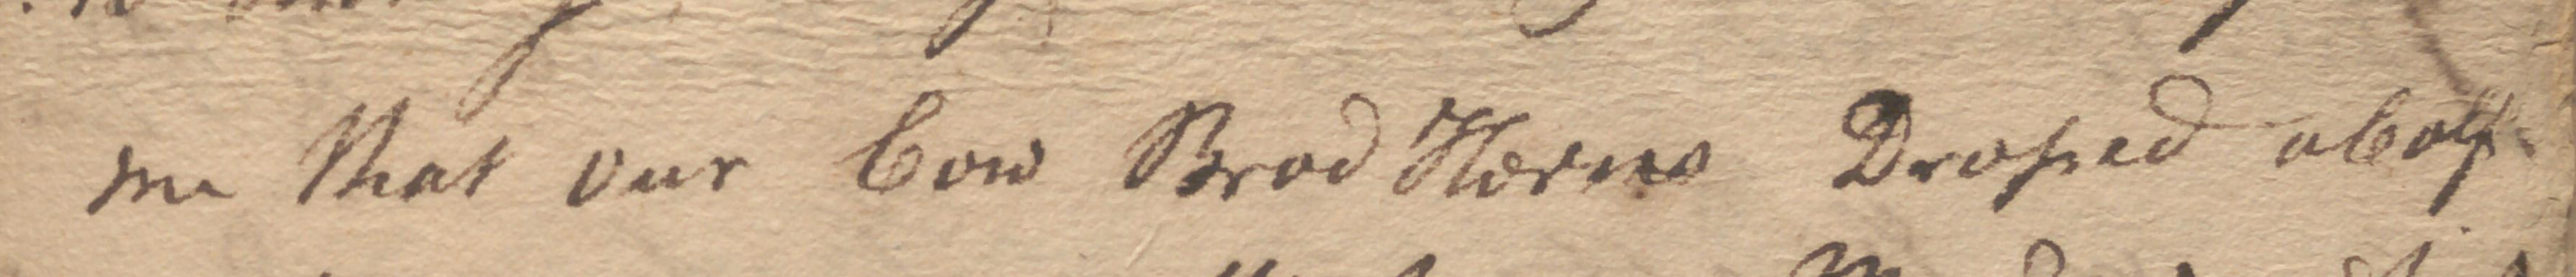me that our Cow Brod Horns Droped a Calf
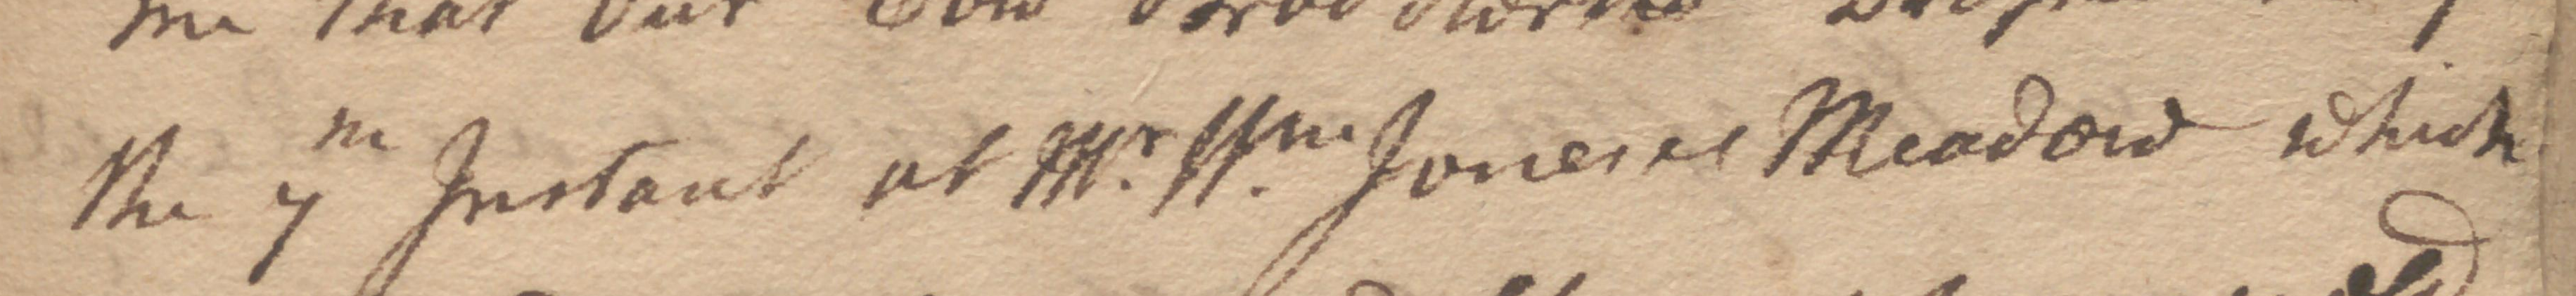the 7^th. Instant at M^r. W^m. Joneses Meadow which
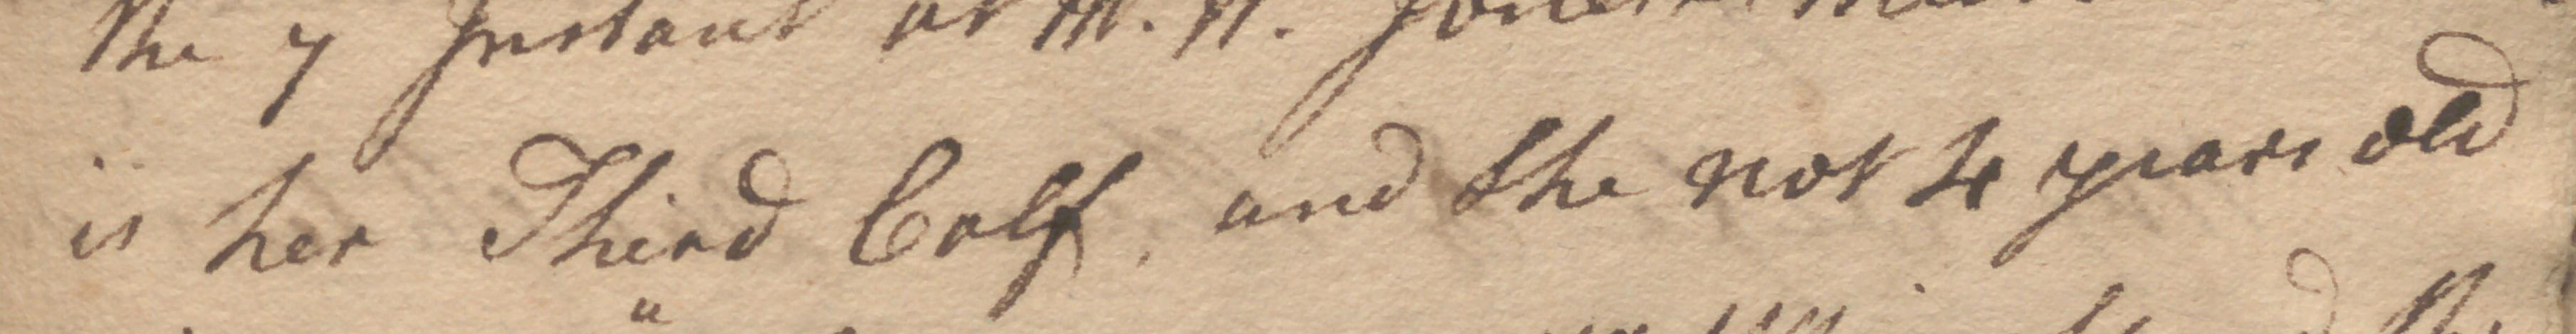is her Third Colf and she not 4 years old
